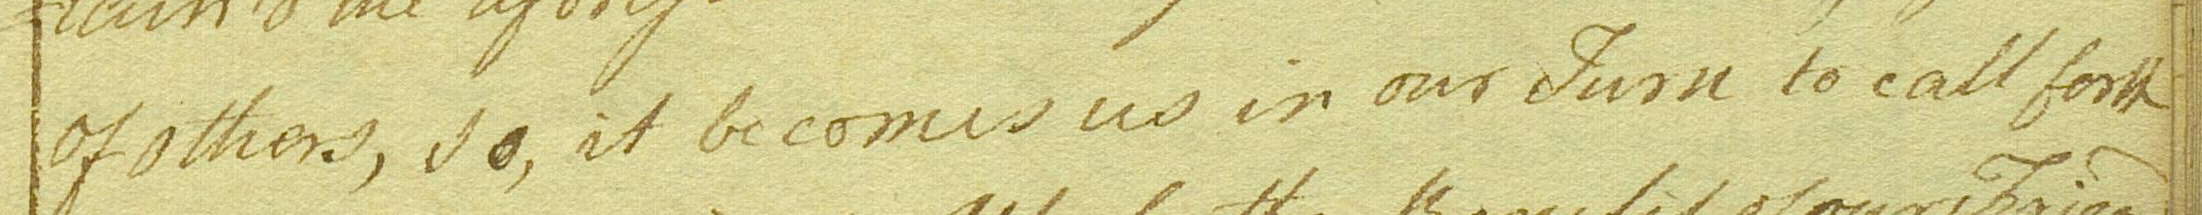of Others, so, it becomes us in our Turn to call forth
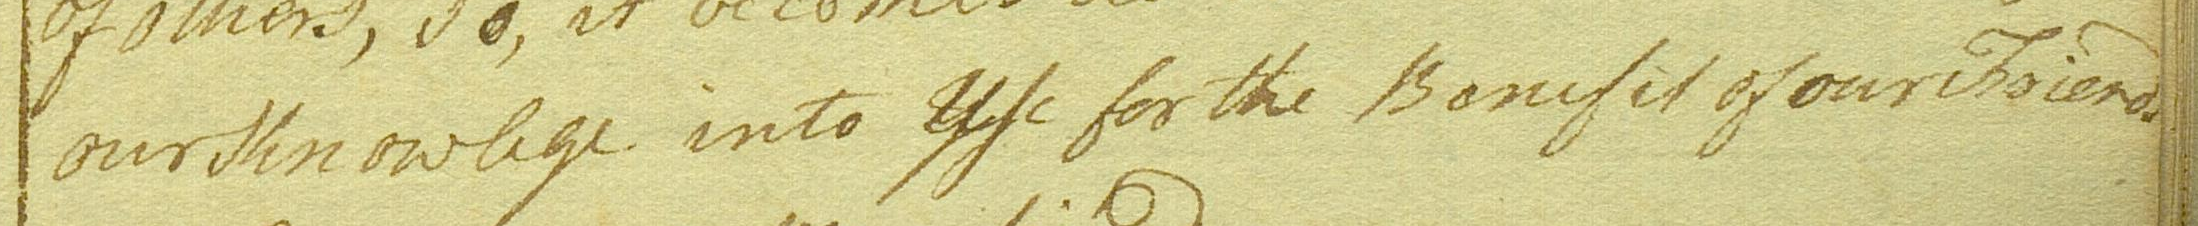our Knowledge into Use for the Benefit of our Friend,
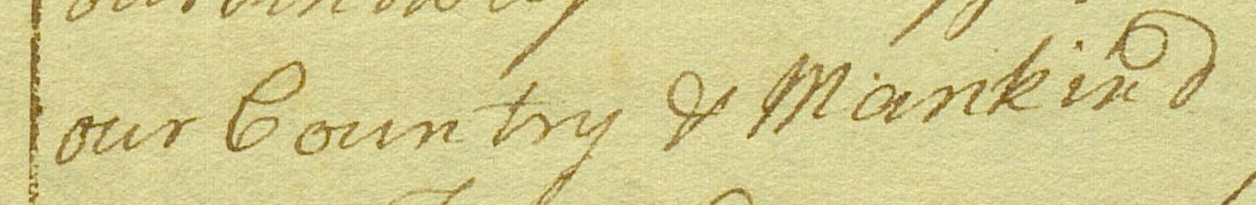our Country & Mankind
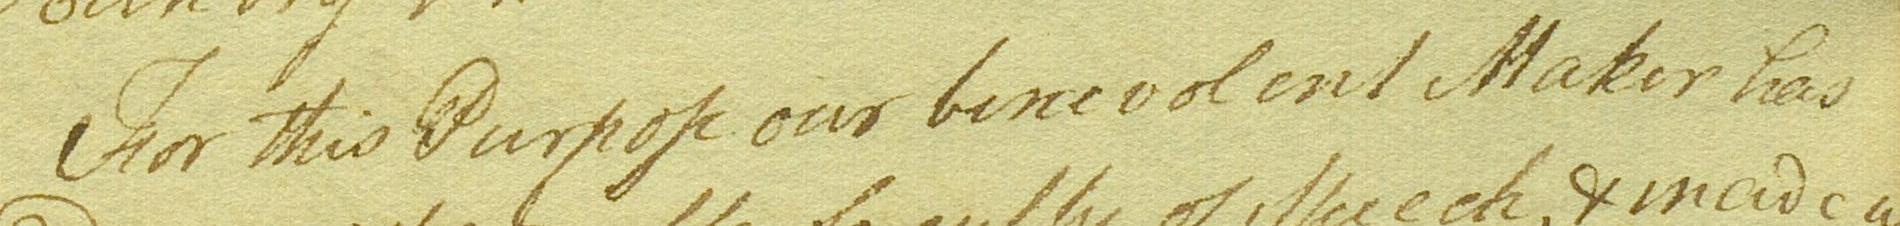For this Purpose our benevolent Maker has
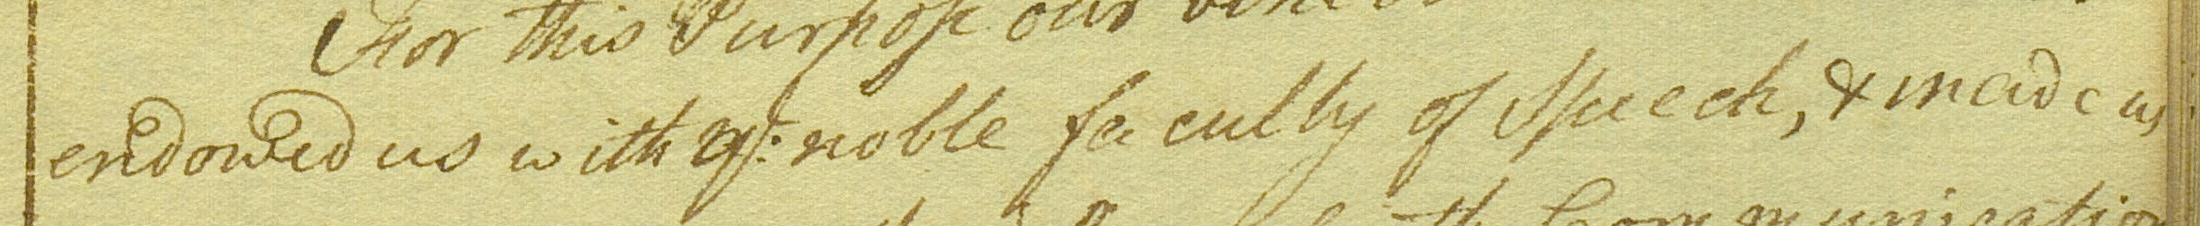endowed us with y^e. noble faculty of Speech, & made us
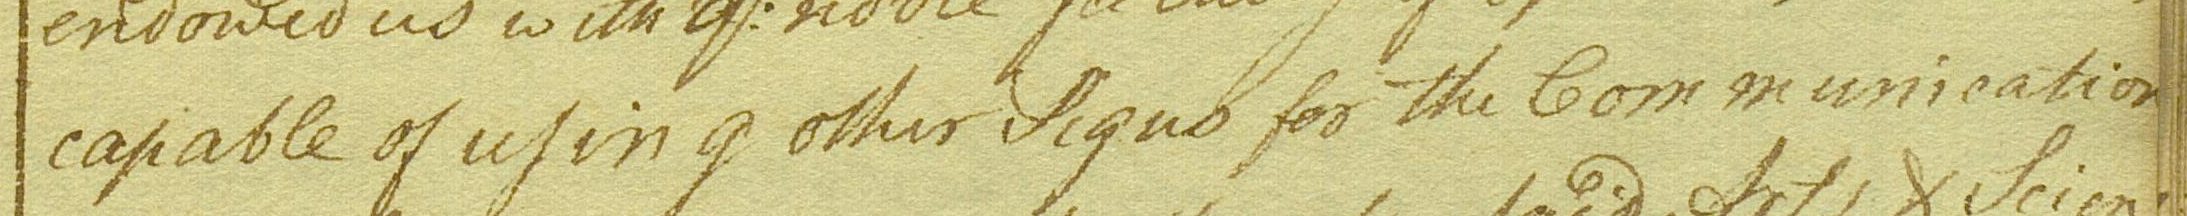capable of using other Signs for the Communication
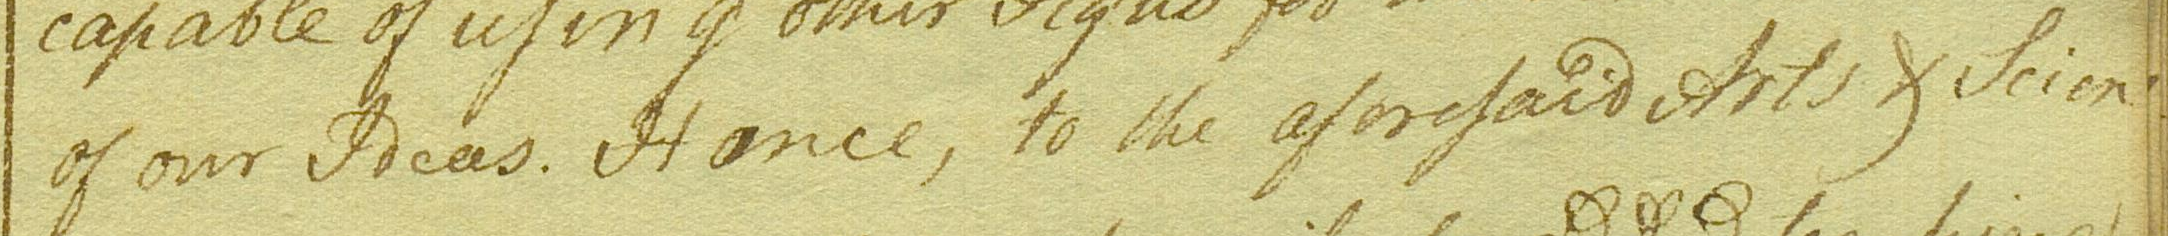of our Ideas. Hence, to the aforesaid Arts & Scien
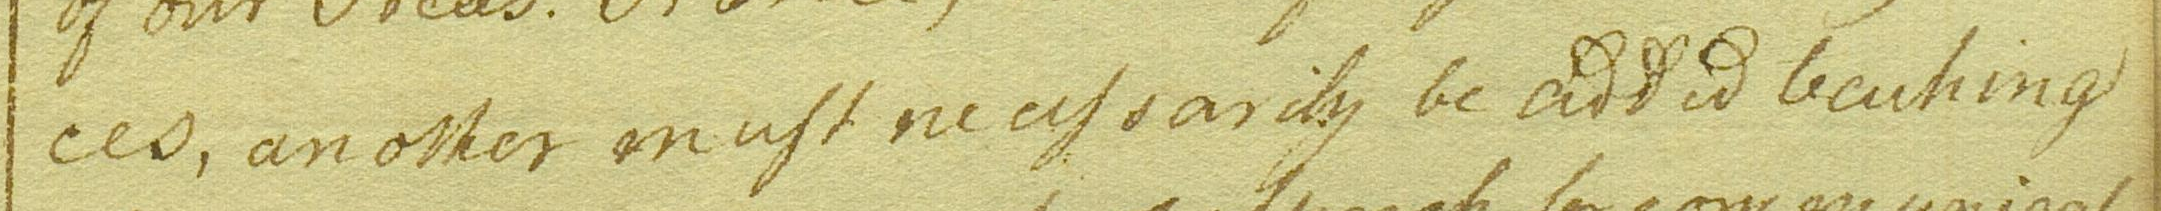ces, an other must necessarily be added teaching
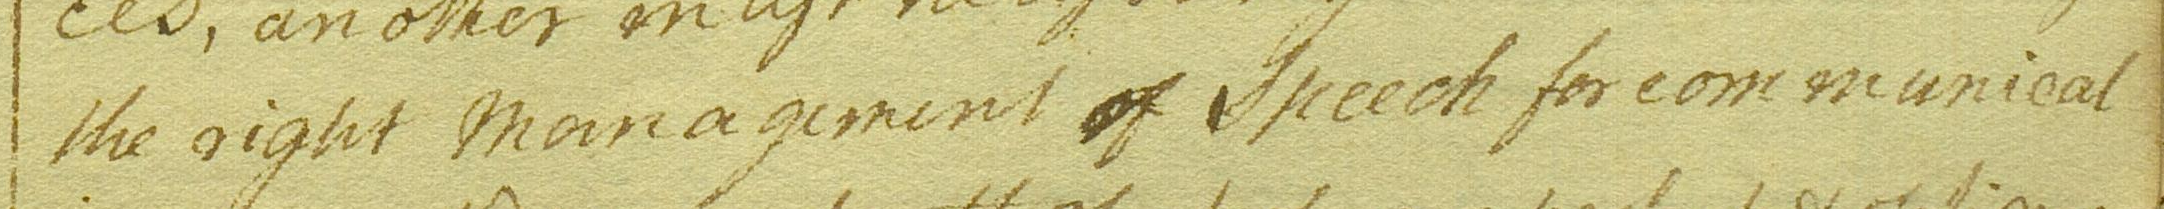the right management of Speech for communicat
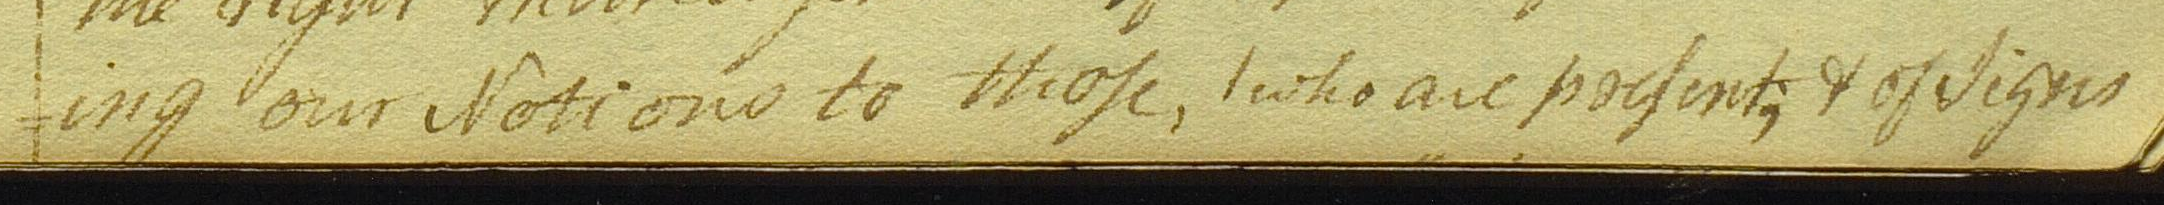-ing our Notions to those, who are present; & of Signs
